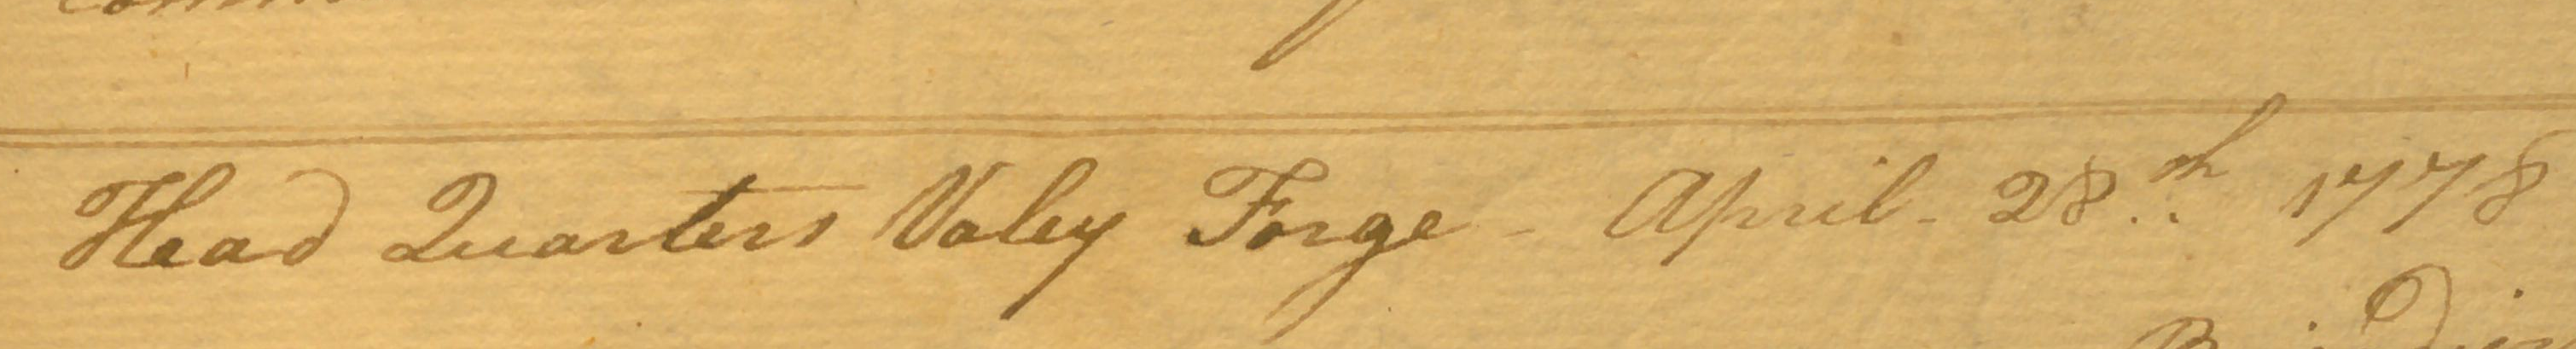Head Quarters Valey Forge April 28^th. 1778
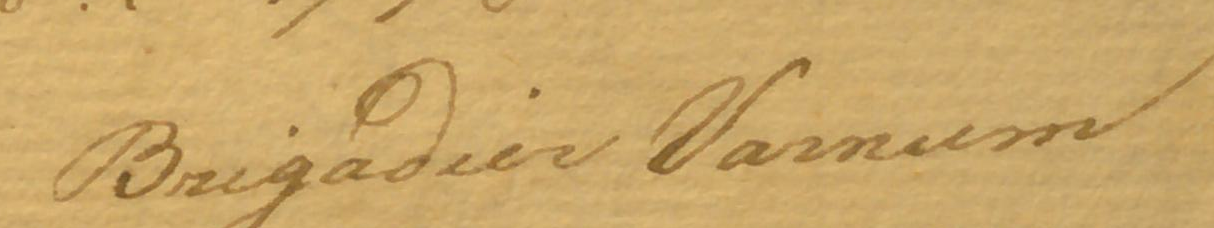Brigadier Varnum
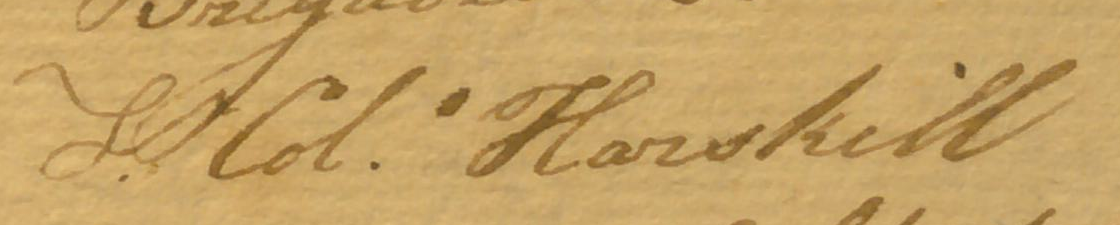L^t. Col^o. Harskill
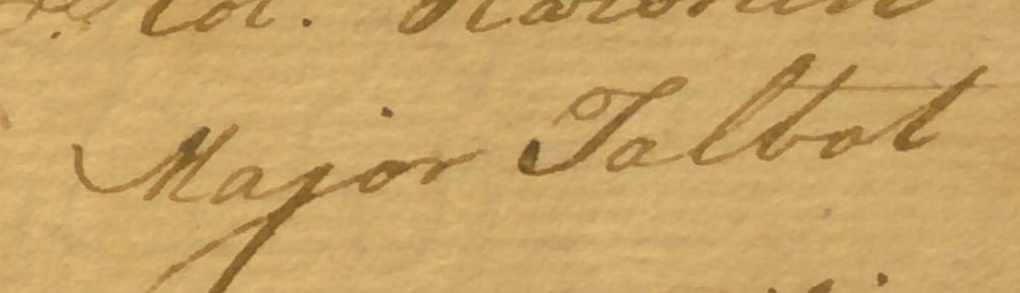Major Talbot
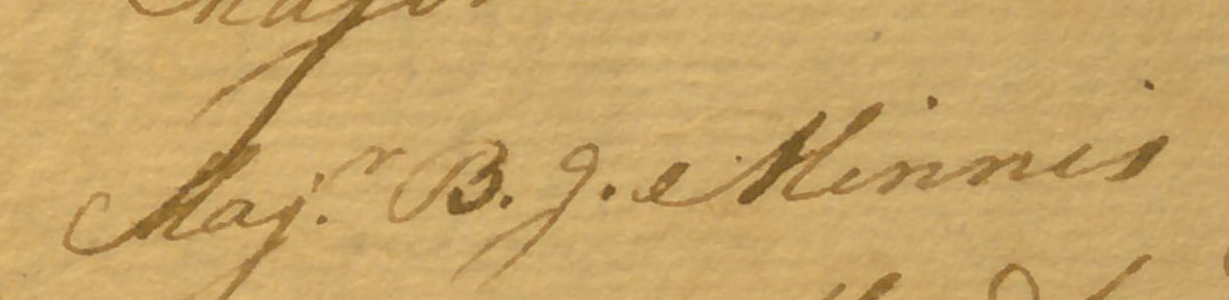Maj^r. B.^g. Minnis
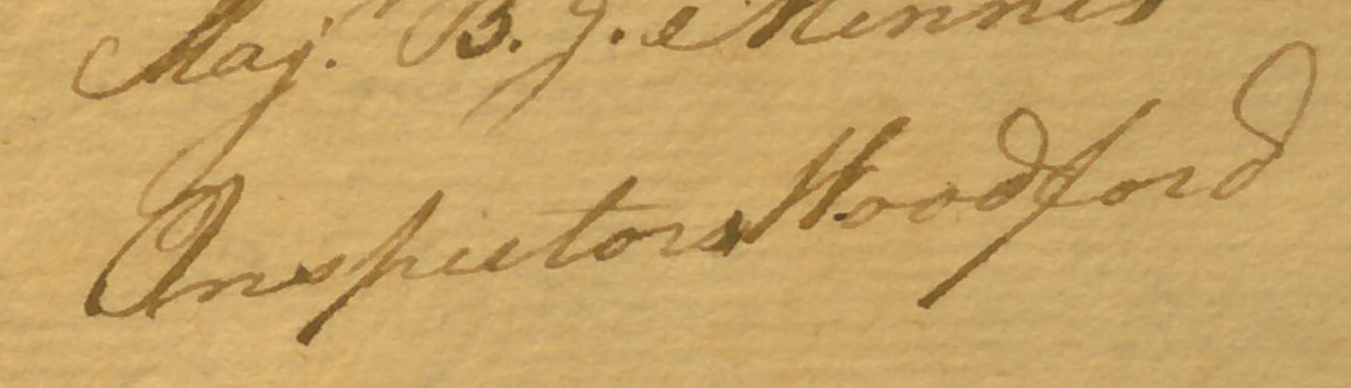Inspectors Woodford
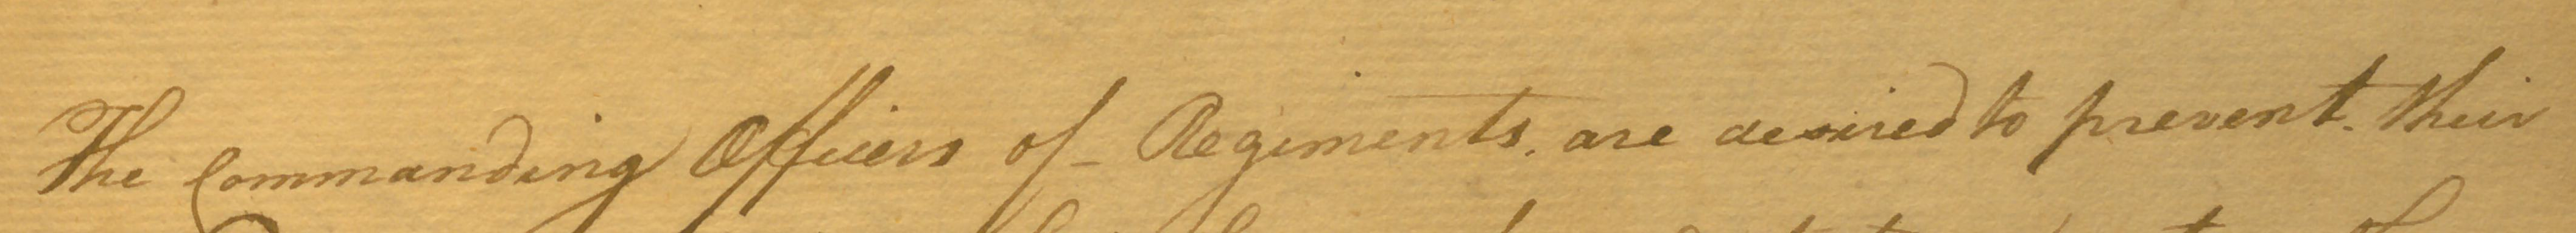The Commanding Officers of Regiments are desired to present their
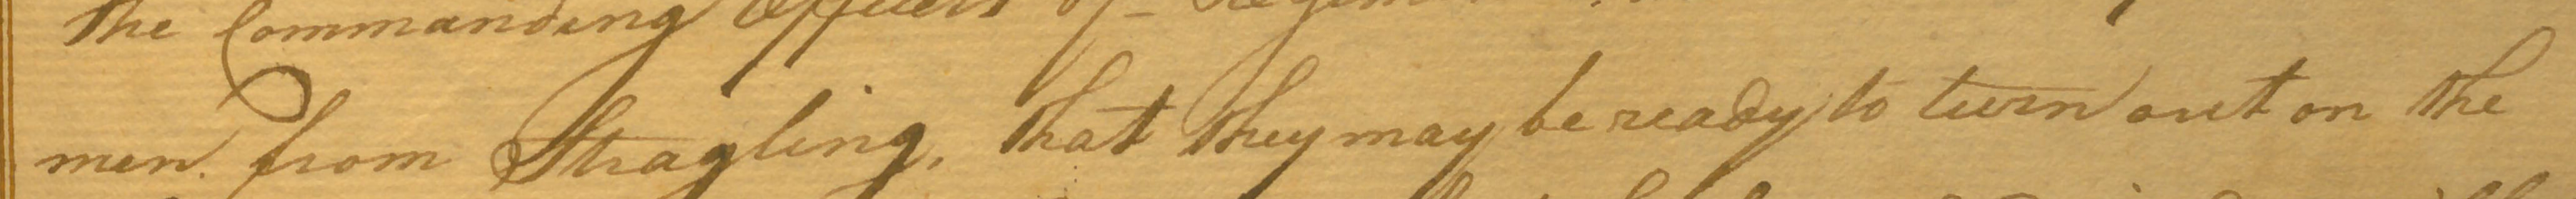men from Stragling, that they may be ready to turn out on the
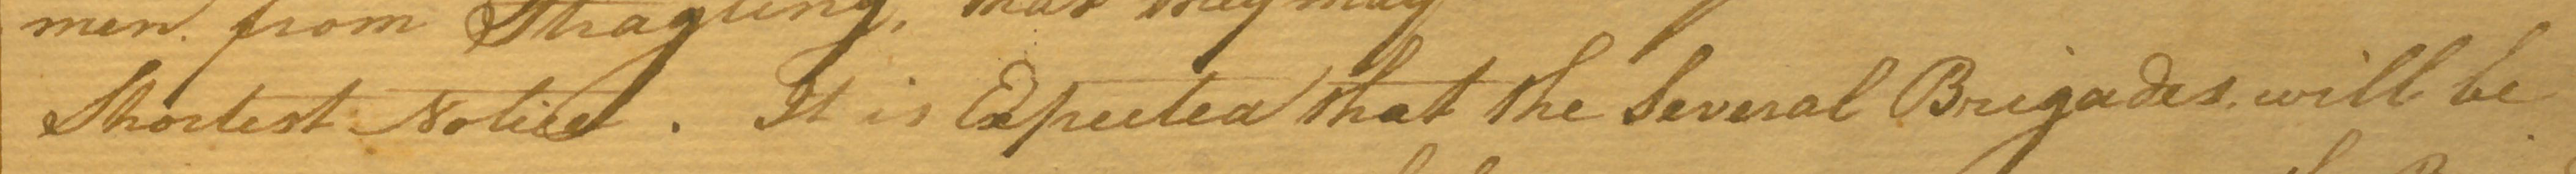shortest Notice. It is Expected that the Several Brigades will be
